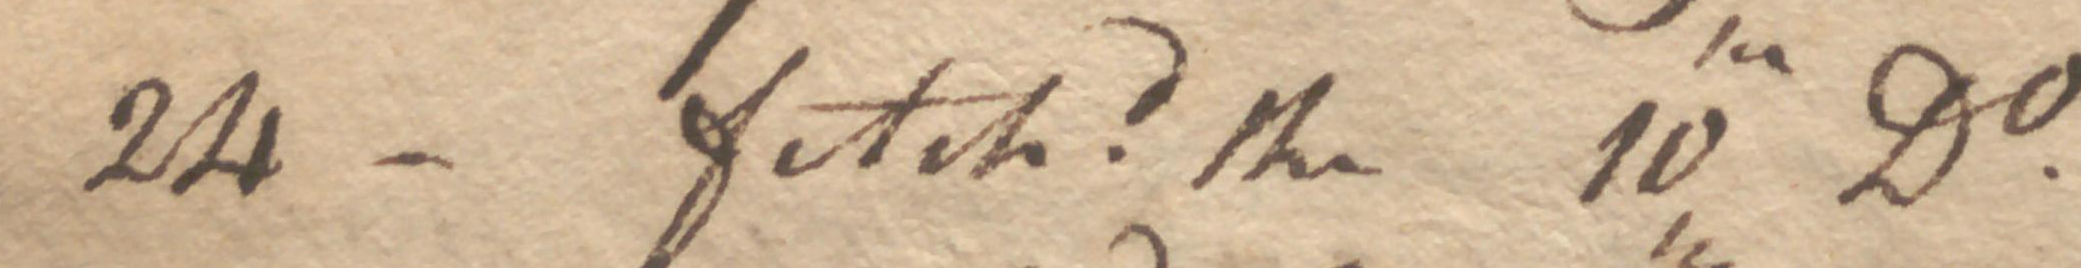24- fetch^d. the 10^th D^o.
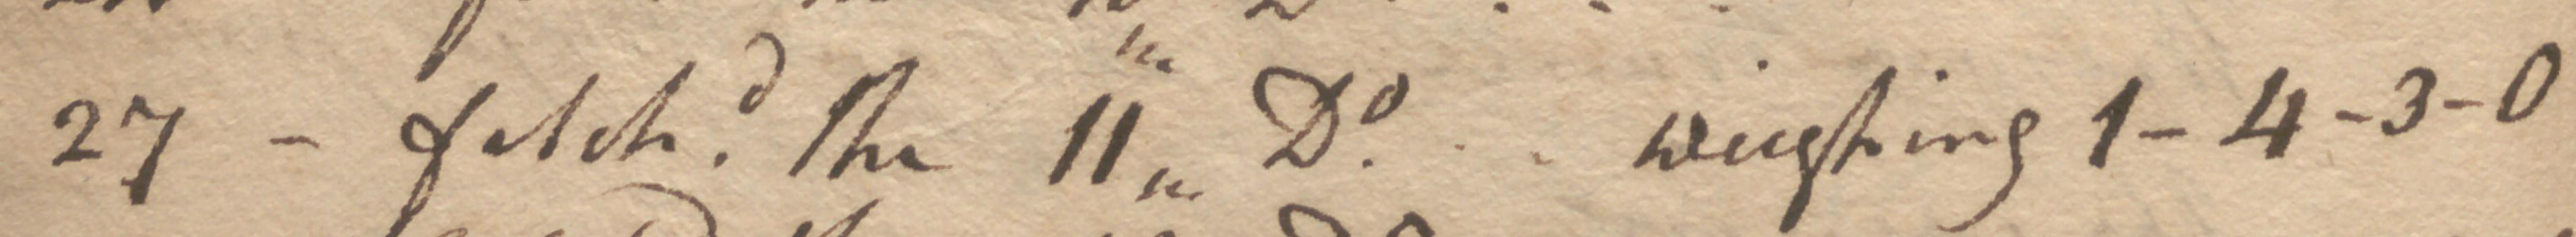27- fetch^d. the 11^th. D^o. weighing 1-4-3-0
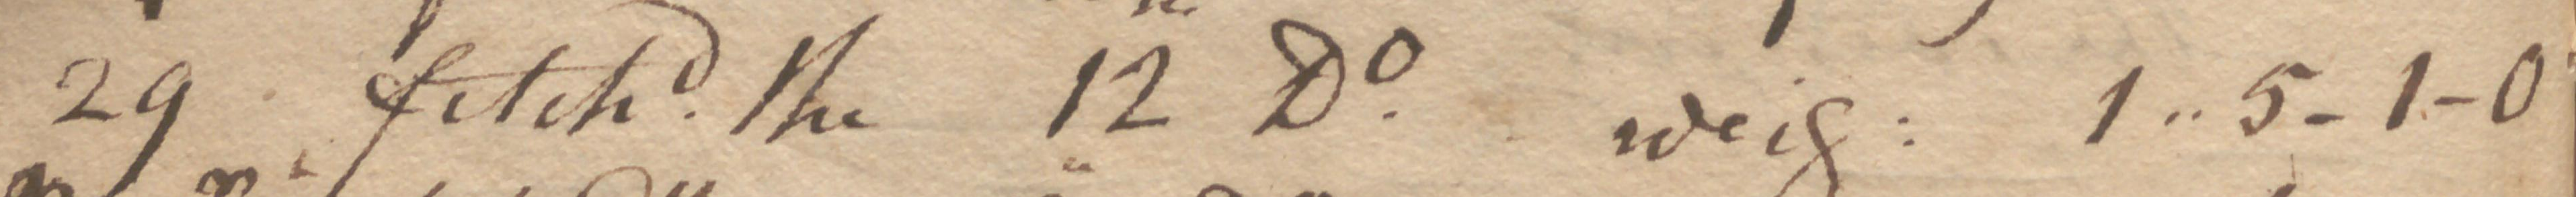29 fetch^d. the 12^th D^o. weig. 1..5-1-0
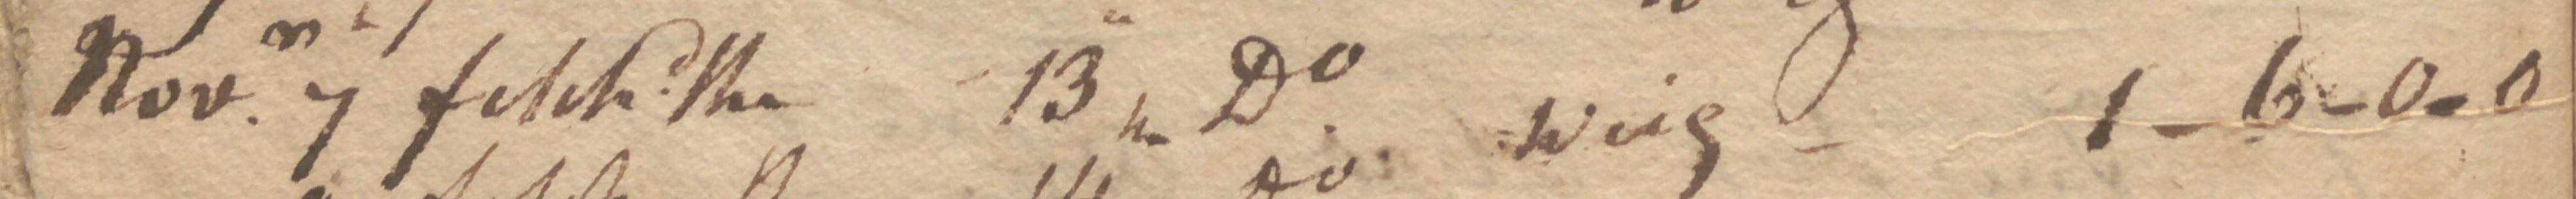Nov^r. 7 fetch^d the 13^h D^o. weig 1-6-0-0
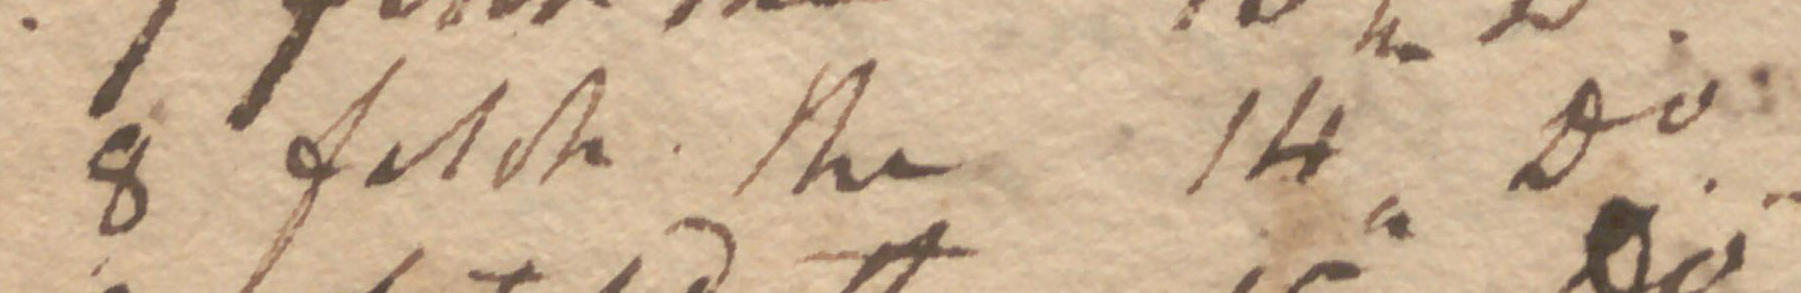8 fetch the 14^th D^o.
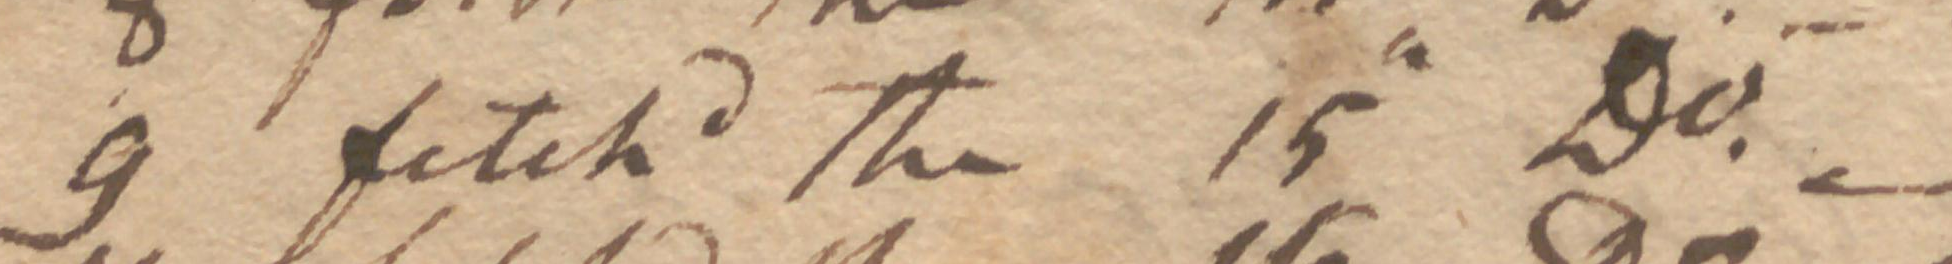9 fetch^d. the 15^th D^o.-
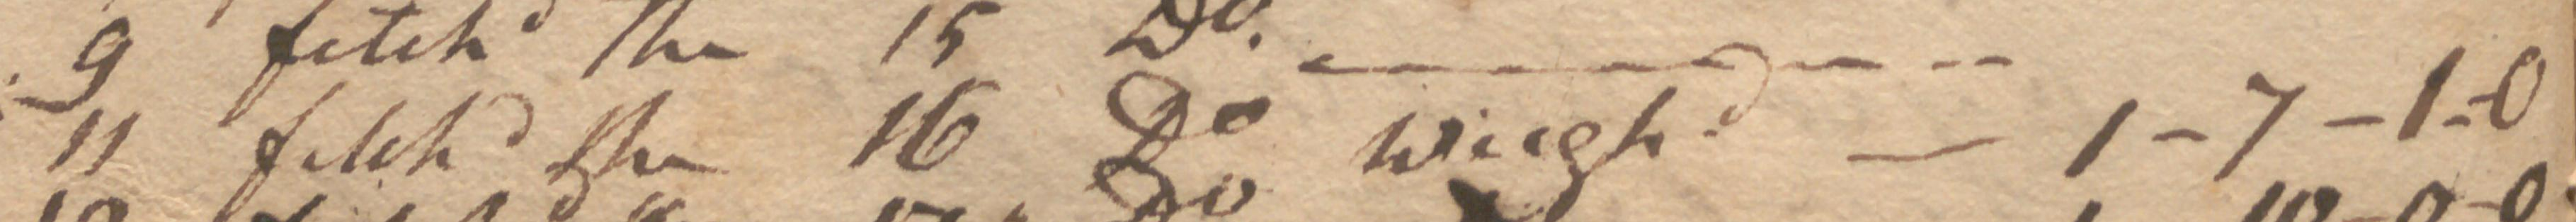11 fetch^d the 16 D^o. weigh^d.- 1-7-1-0
